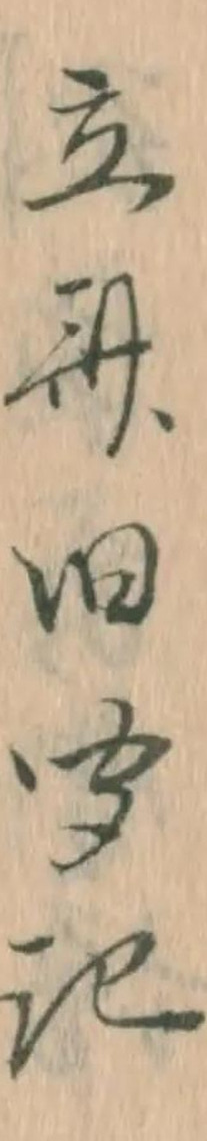立斎旧聞記
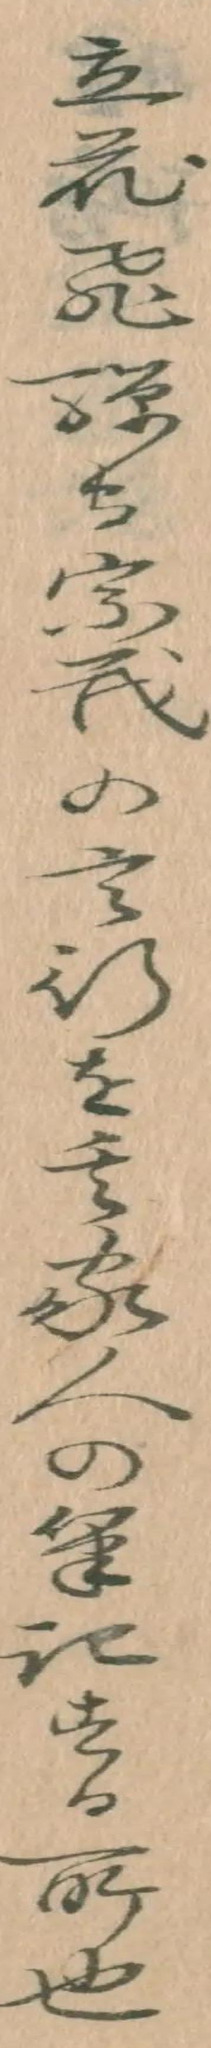立花飛騨守宗茂の言行を其家人の筆記する所也
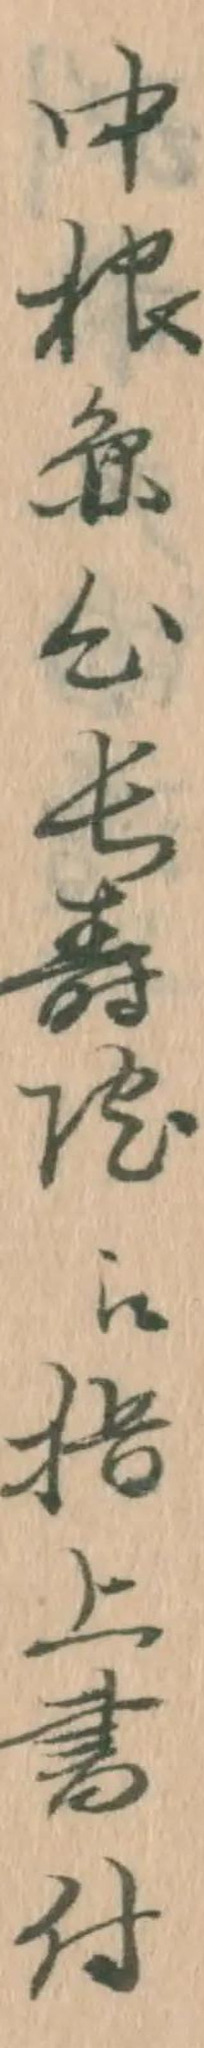中根円心長寿院江指上書付
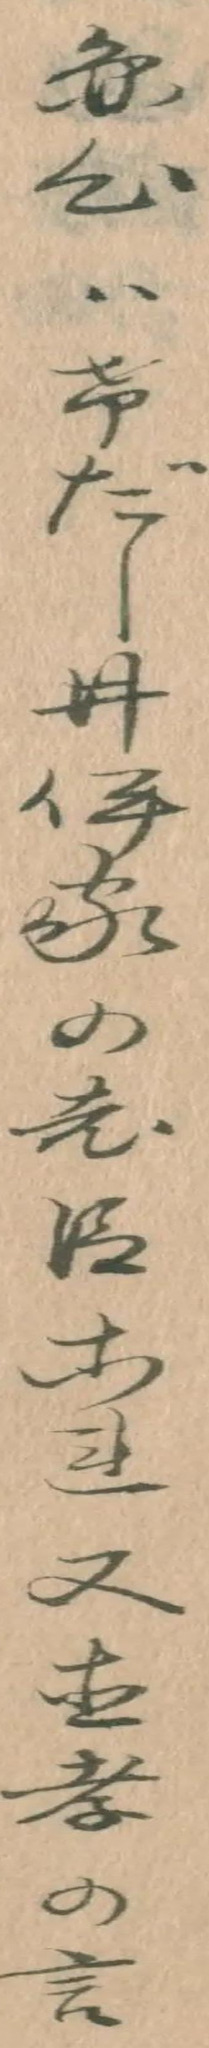円心はけだし井伊家の老臣これ又直孝の言
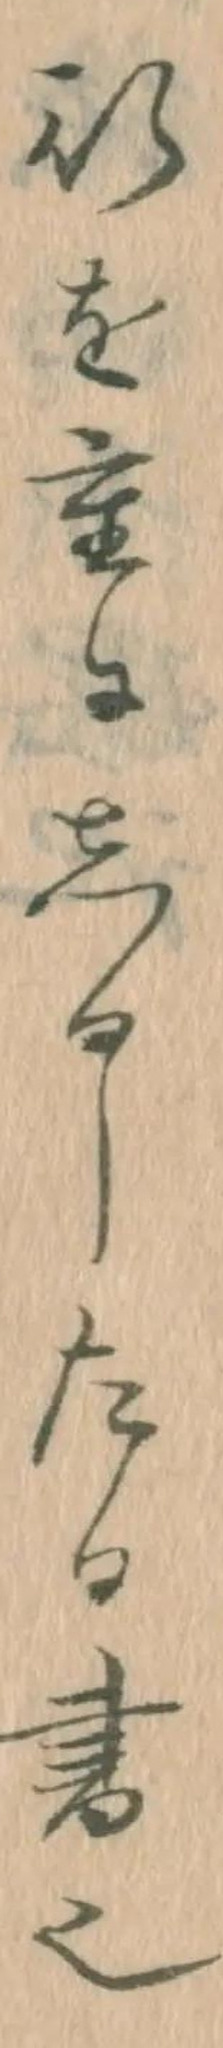行を重にしるしたる書也
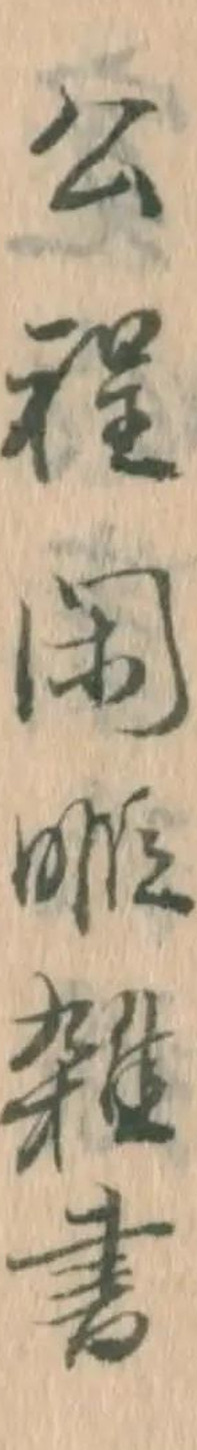公程閑暇雑書
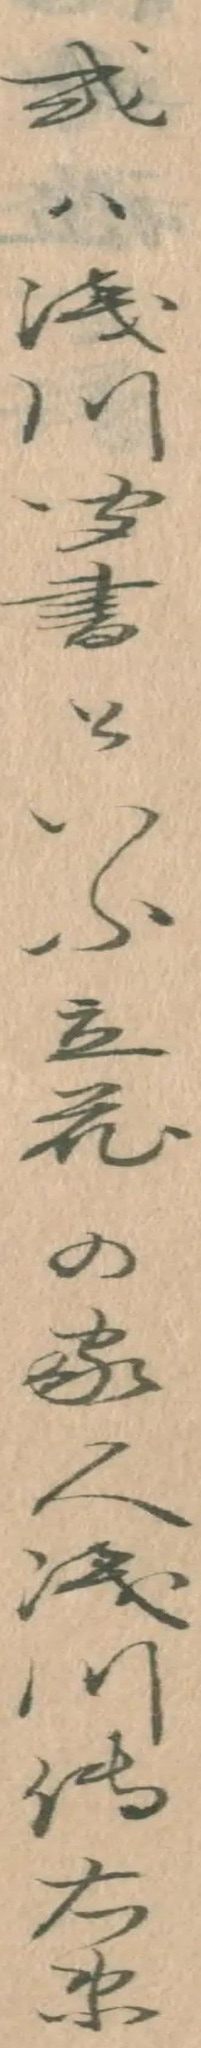或は浅川聞書といふ立花の家人浅川伝右衛
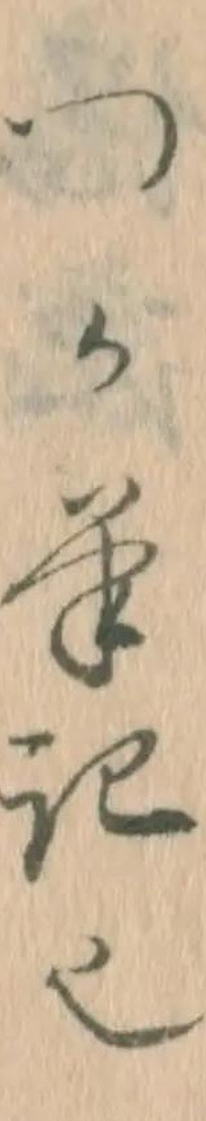門か筆記也
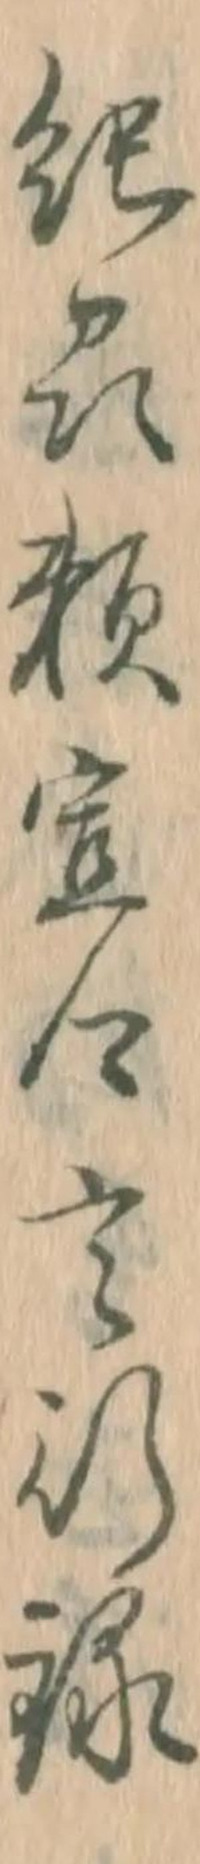紀州頼宣卿言行録
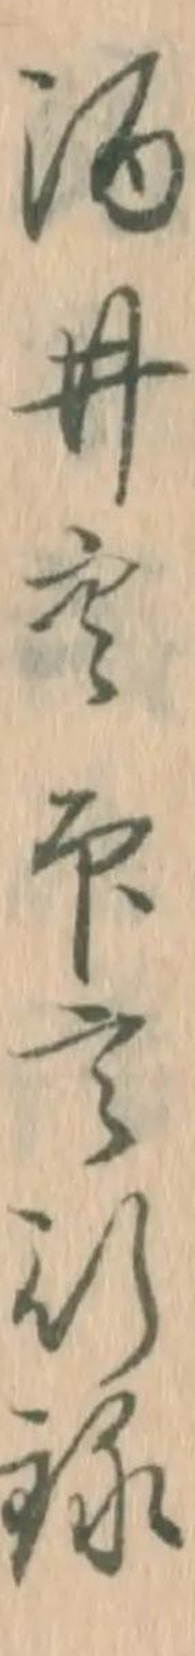酒井空印言行録

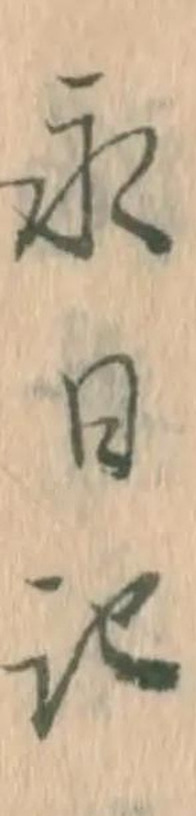永日記
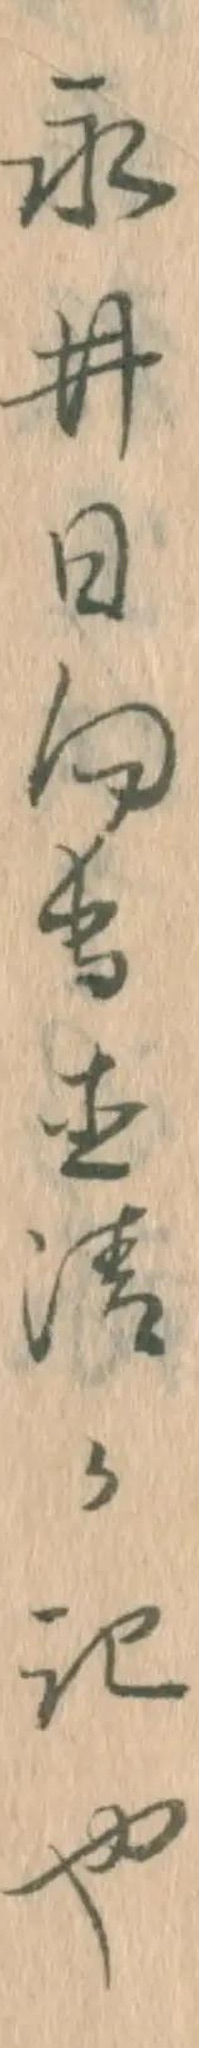永井日向守直清か記也
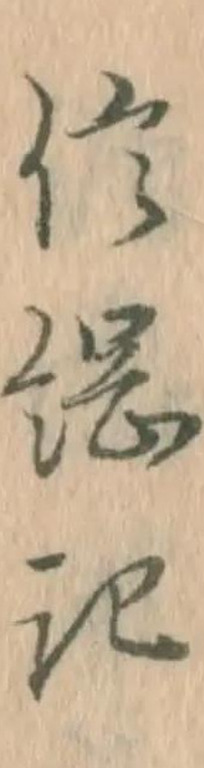信綱記
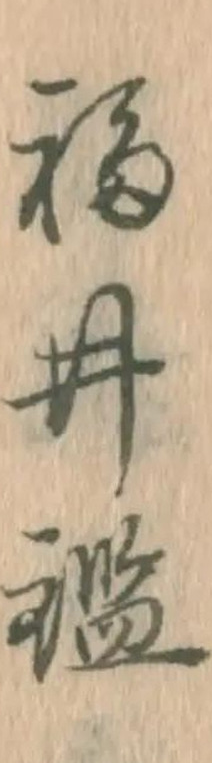福井鑑
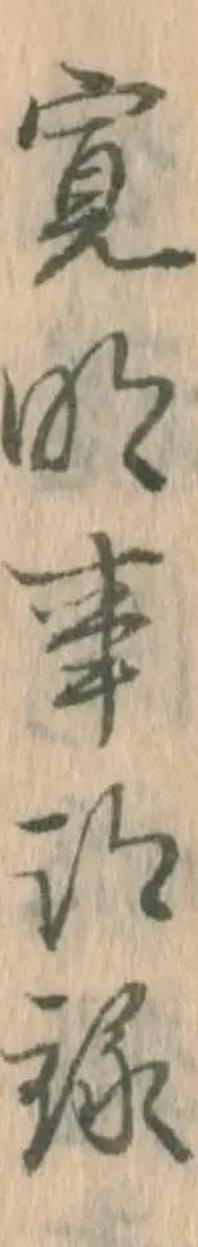寛明事跡録
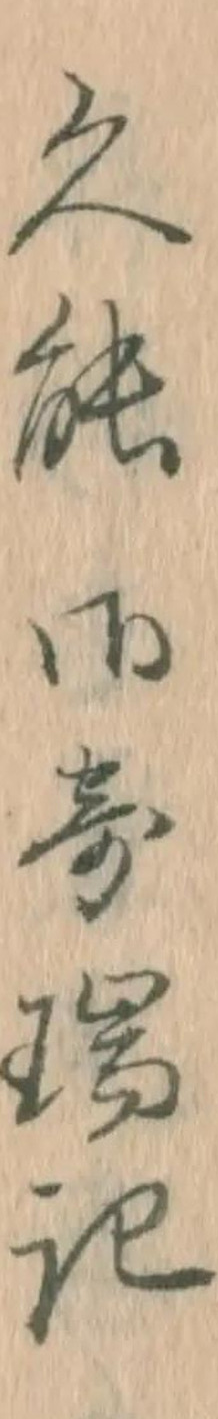久能御奇瑞記
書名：切支丹御退治記 49巻. [1]
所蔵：国立国会図書館 National Diet Library, JAPAN
